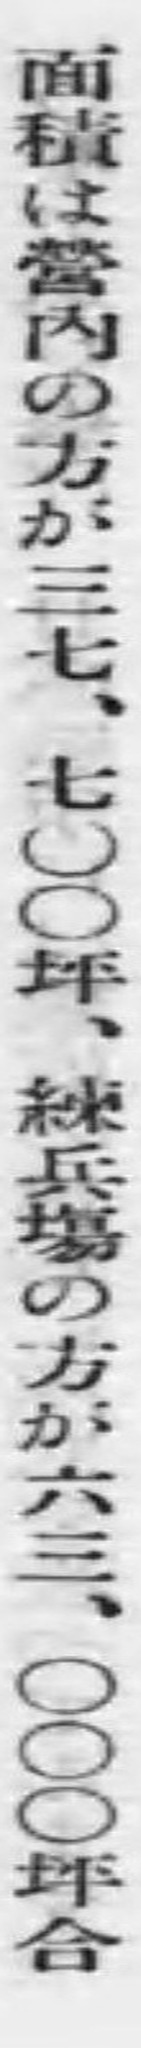面積は営内の方が三七、七〇〇坪、練兵場の方が六三、〇〇〇坪合
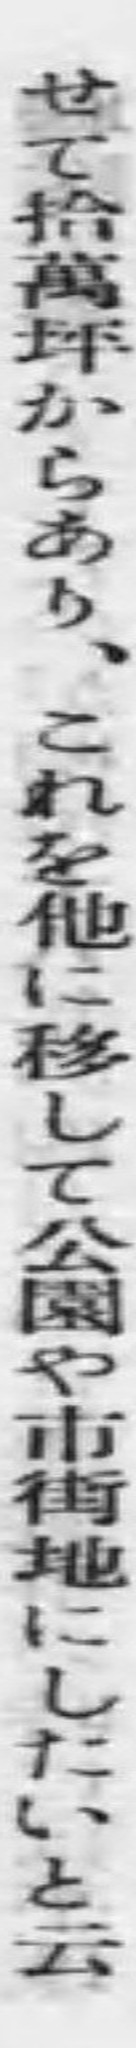せて拾萬坪からあり、これを他に移して公園や市街地にしたいと云
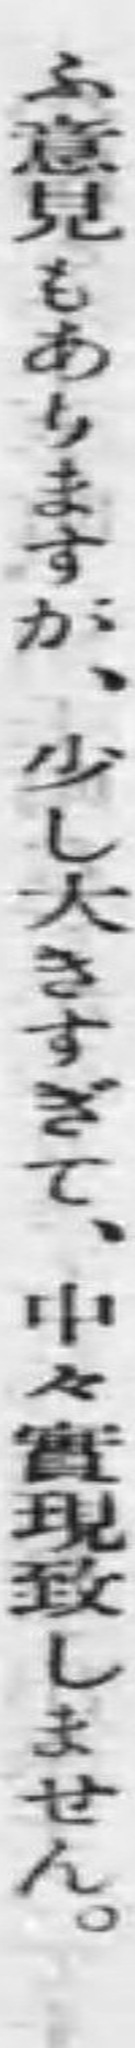ふ意見もありますが、少し大きすぎて、中々実現致しません。
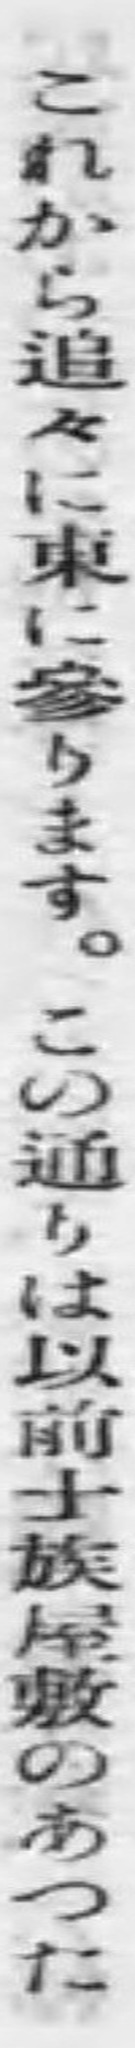これから追々に東に参ります。この通りは以前士族屋敷のあつた
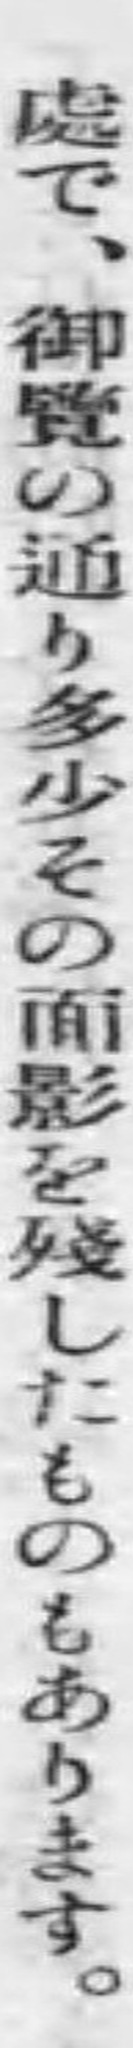処で、御覧の通り多少その面影を残したものもあります。
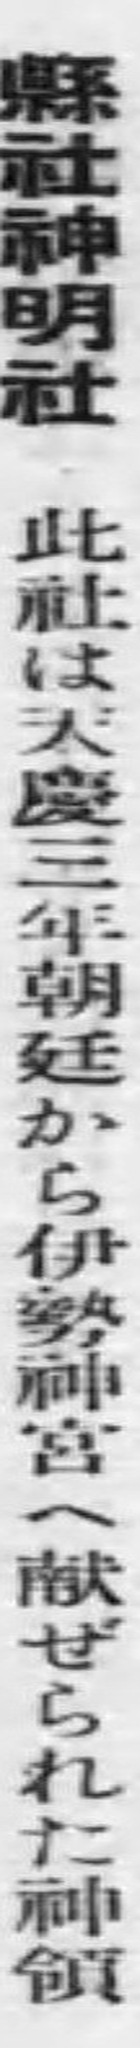県社神明社此社は天慶三年朝廷から伊勢神宮へ献ぜられた神領
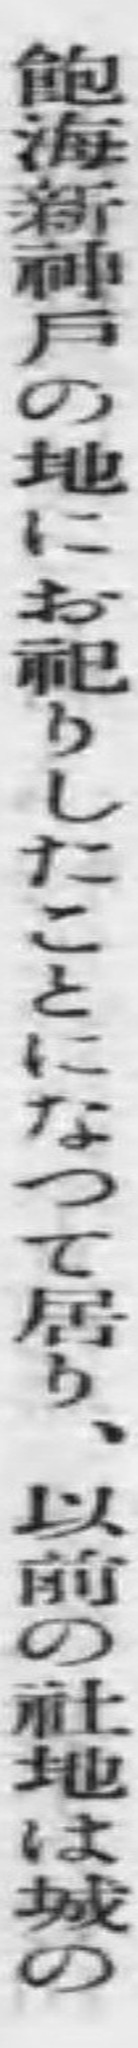飽海新神戸の地にお祀りしたことになつて居り、以前の社地は城の
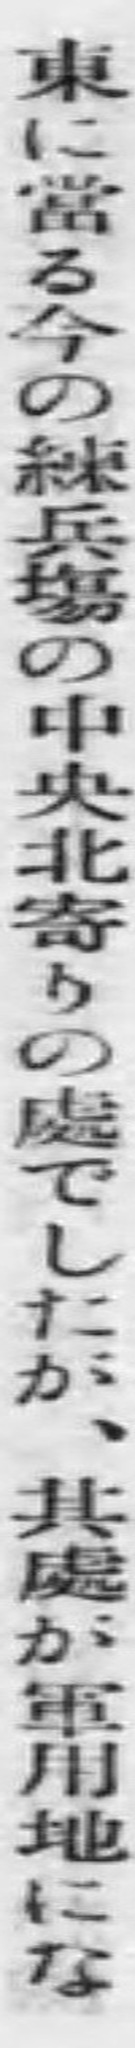東に当る今の練兵場の中央北寄りの処でしたが、其処が軍用地にな
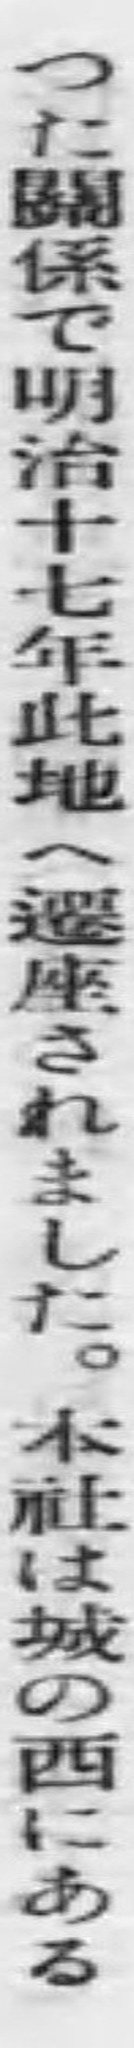つた関係で明治十七年此地へ遷座されました。本社は城の西にある
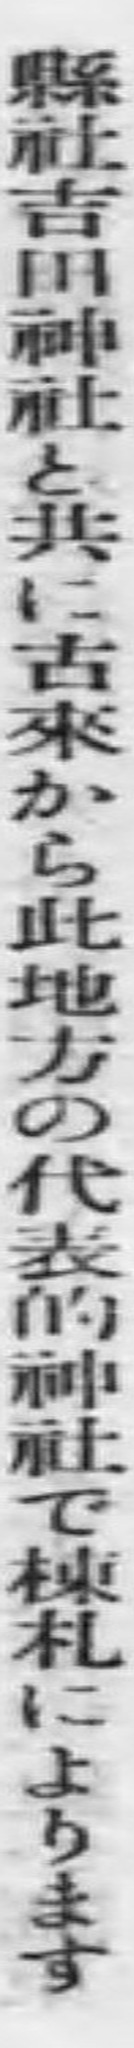県社吉田神社と共に古来から此地方の代表的神社で棟札によります
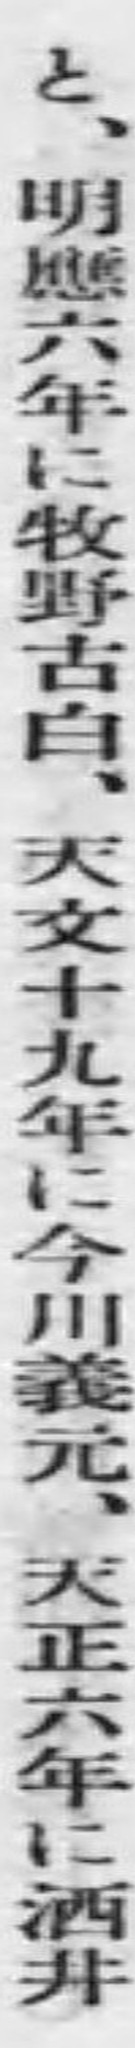と、明応六年に牧野古白、天文十九年に今川義元、天正六年に酒井
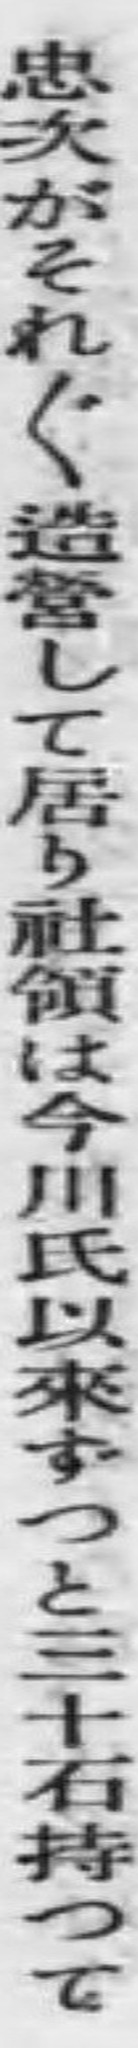忠次がそれ〴〵造営して居り社領は今川氏以来ずつと三十石持つて
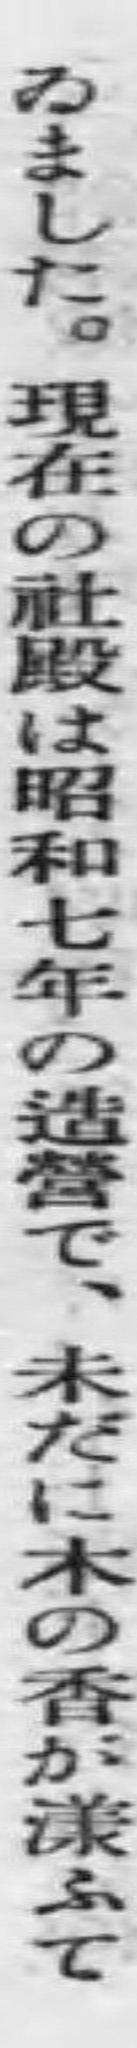ゐました。現在の社殿は昭和七年の造営で、未だに木の香が漾ふて
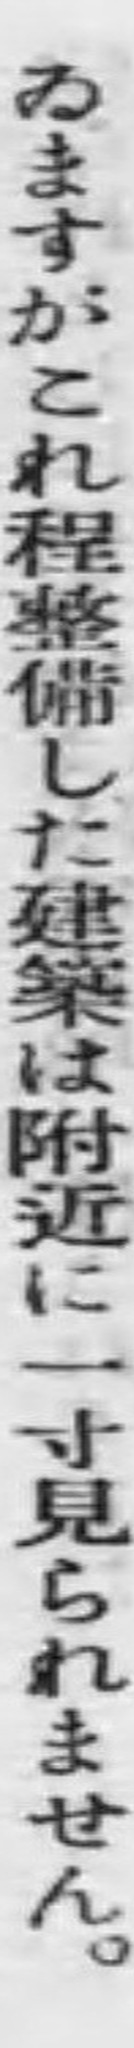ゐますがこれ程整備した建築は附近に一寸見られません。
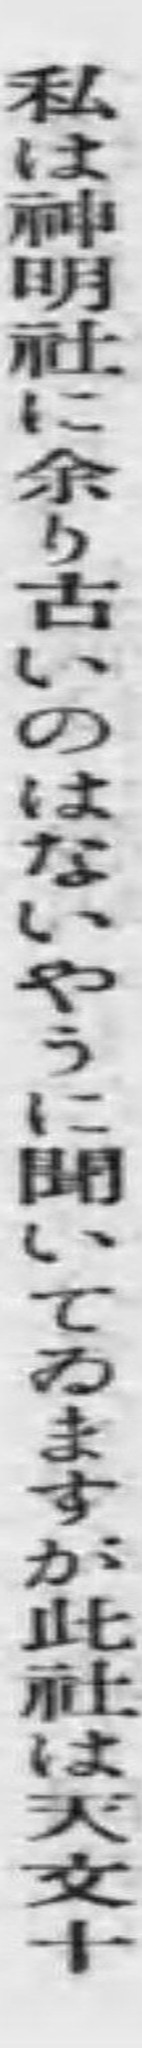私は神明社に余り古いのはないやうに聞いてゐますが此社は天文十
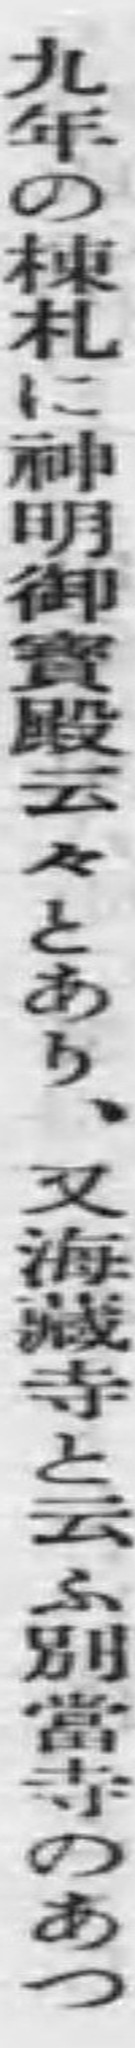九年の棟札に神明御宝殿云々とあり、又海蔵寺と云ふ別当寺のあつ
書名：東三河道中記 : 豊橋市及其附近案内
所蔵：国立国会図書館 National Diet Library, JAPAN
